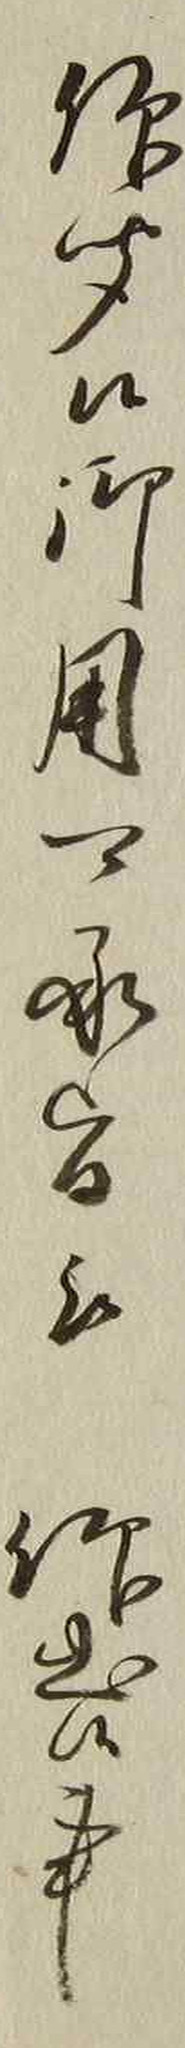仰聞候御用可承旨被仰出候事
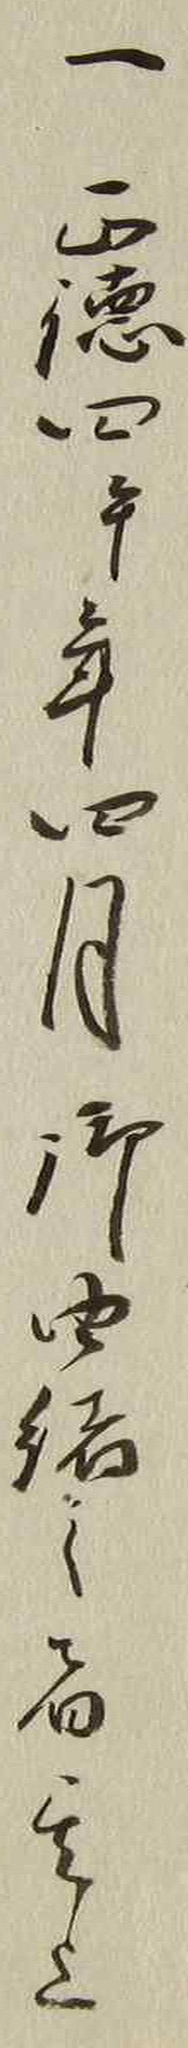一正徳四午年四月御由緒之者其上
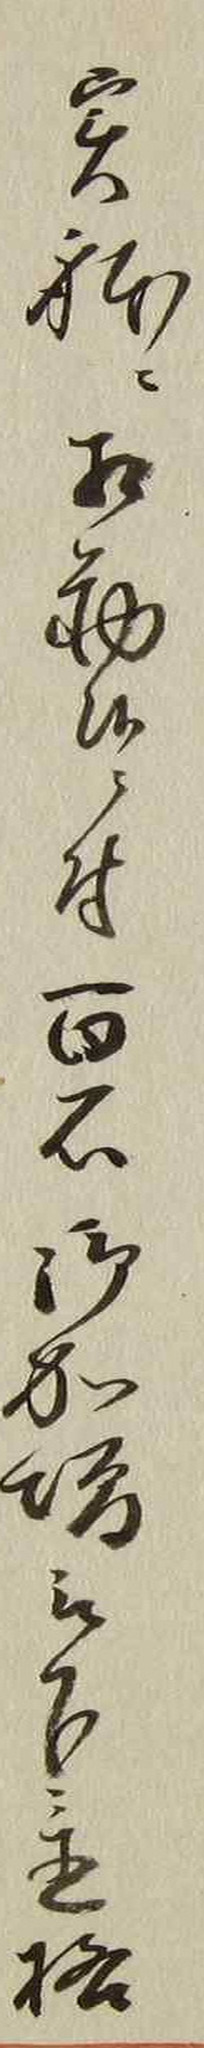実体ニ相勤候ニ付百石御加増被下置格
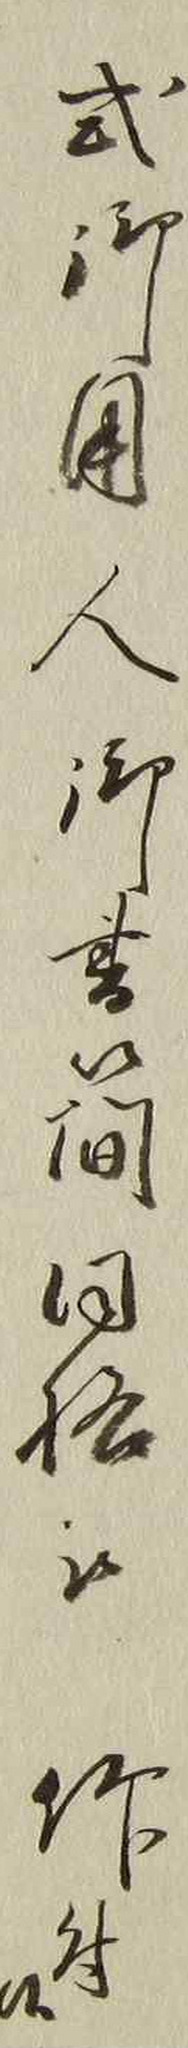式御用人御書簡同格被仰付候
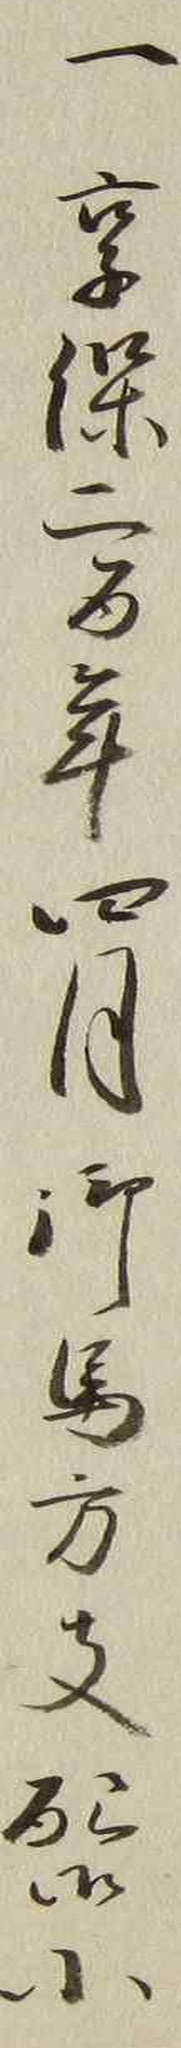一享保二酉年四月御馬方支配御小
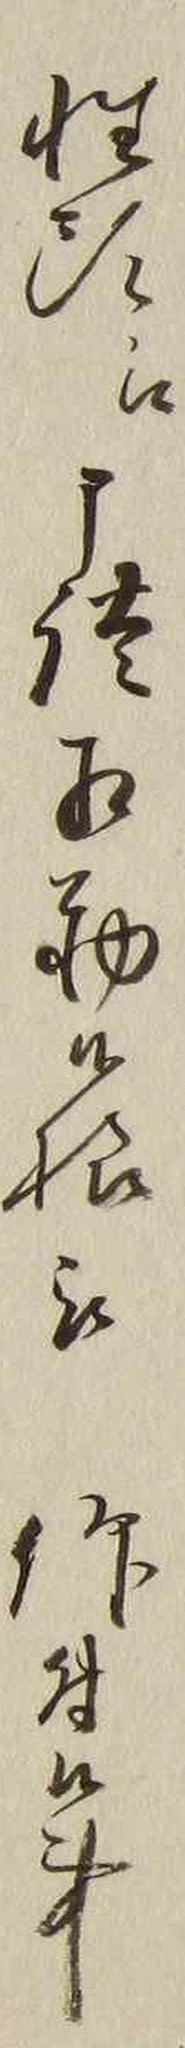性頭江申談相勤候様被仰付候事
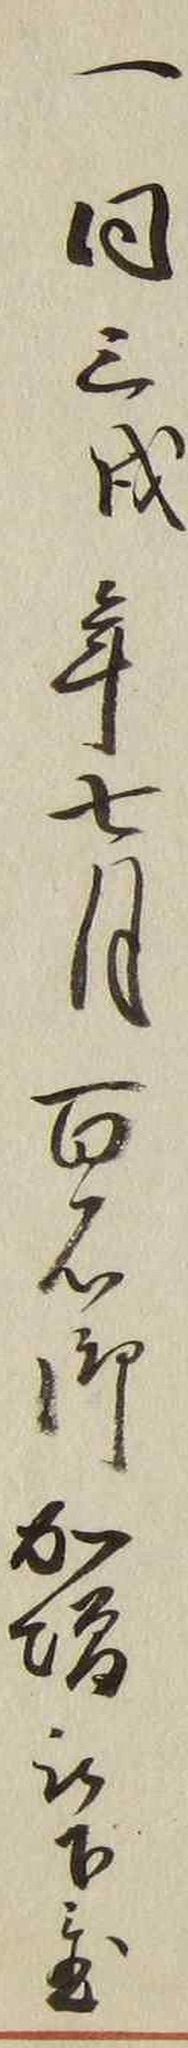一同三戌年七月百石御加増被下置

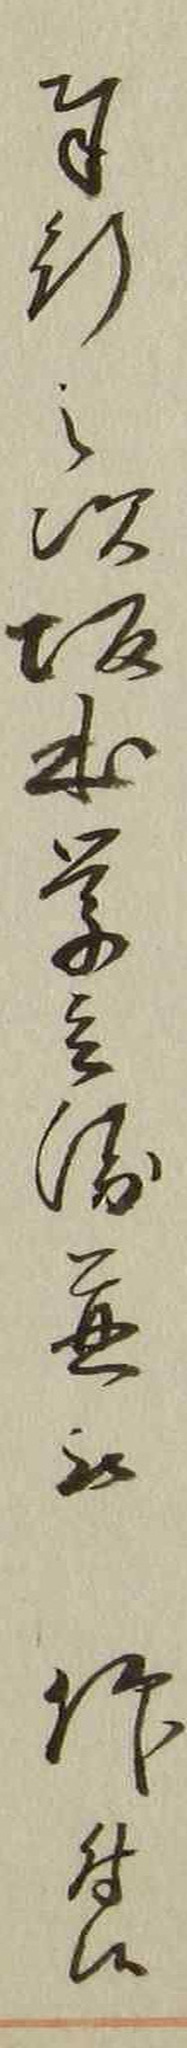奉行之次坂本学兵衛並被仰付候
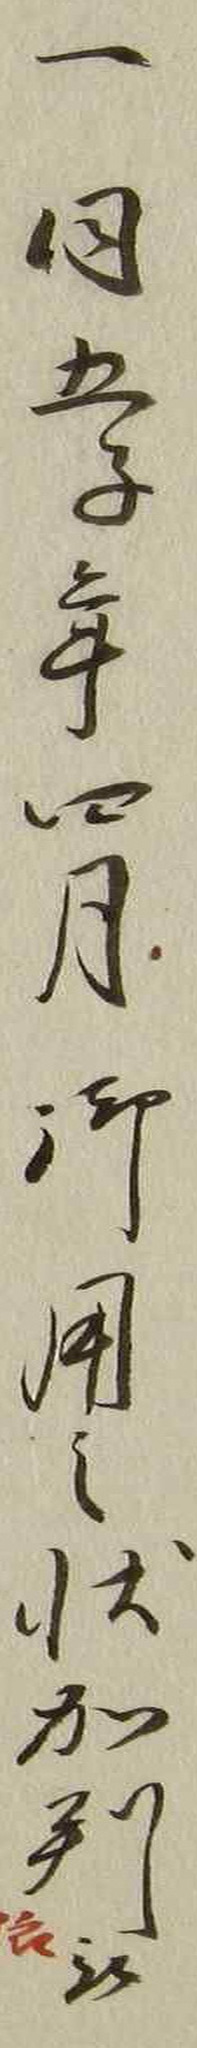一同五子年四月御用之状加判被
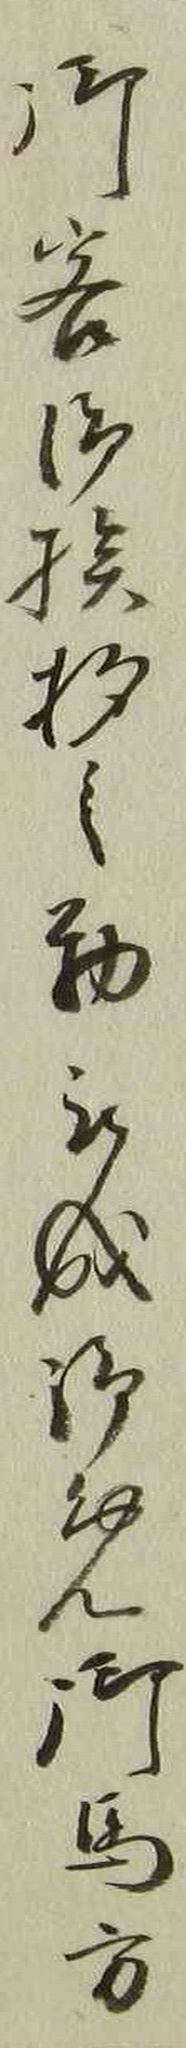御客御挨拶之勤被成御免御馬方
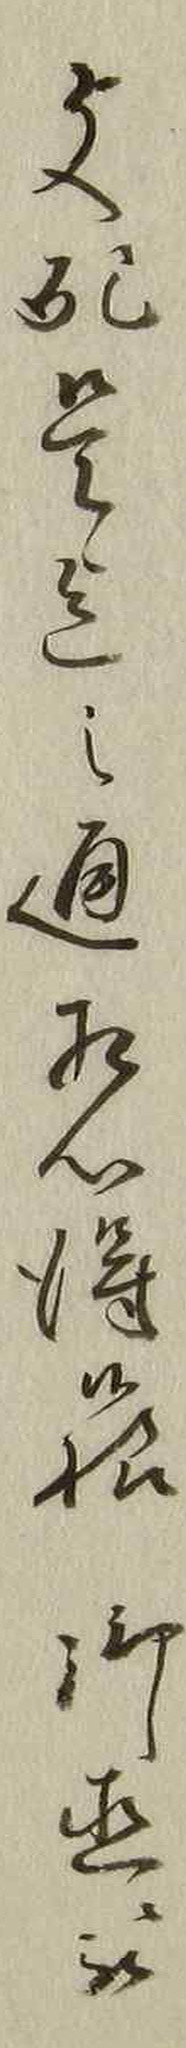支配是迄之通相心得候様御直ニ被
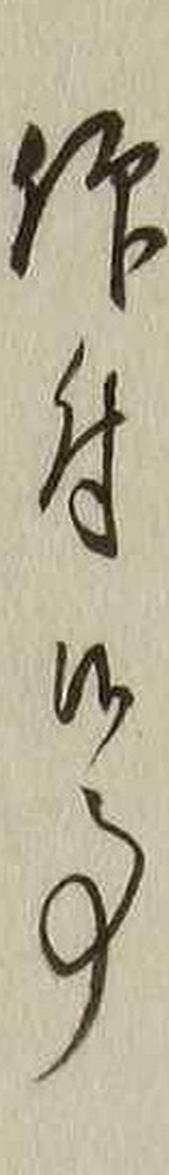仰付候事
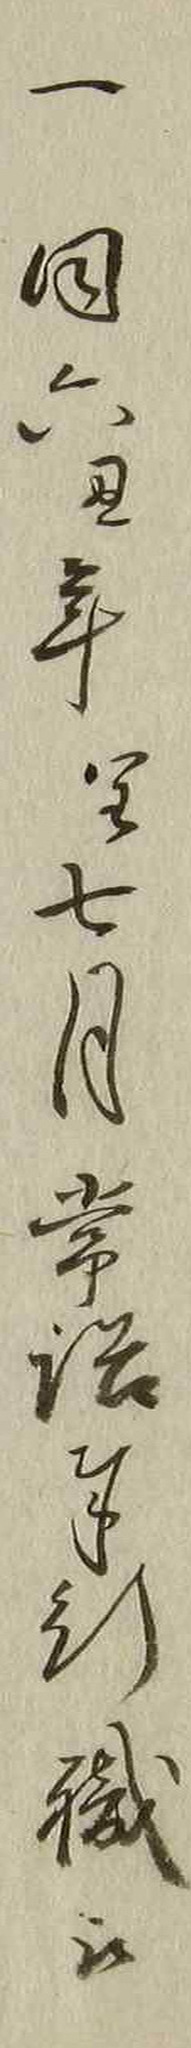一同六丑年閏七月常詰奉行職被
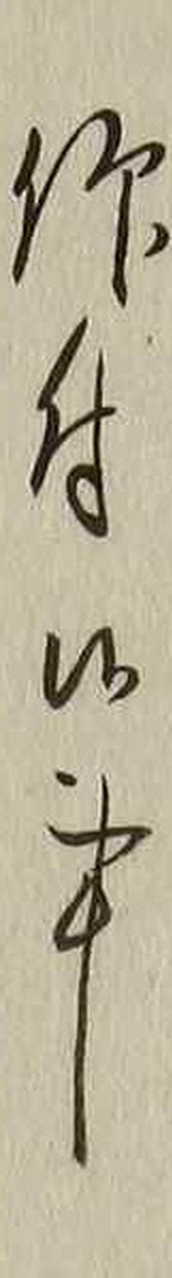仰付候事
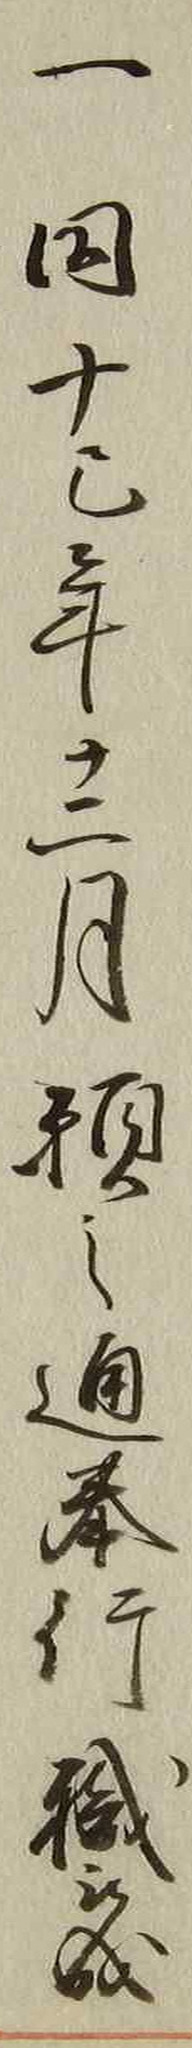一同十巳年十二月願之通奉行職被成
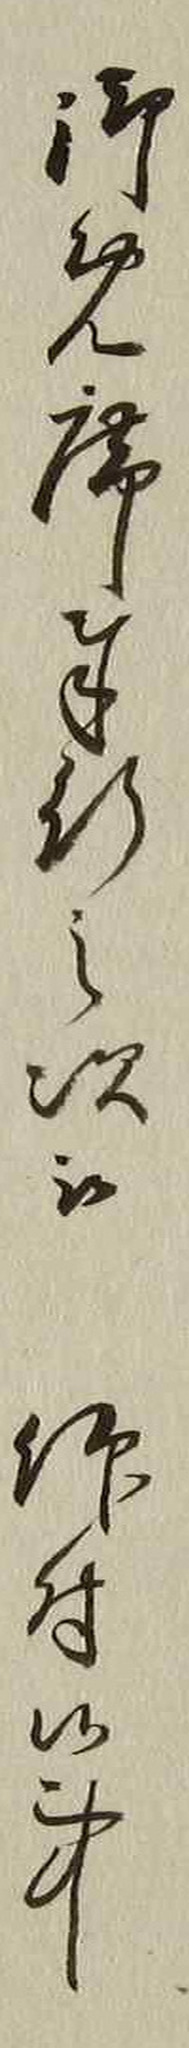御免席奉行之次被仰付候事
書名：諸士系譜　巻之122　よ之部5
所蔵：会津若松市立会津図書館
